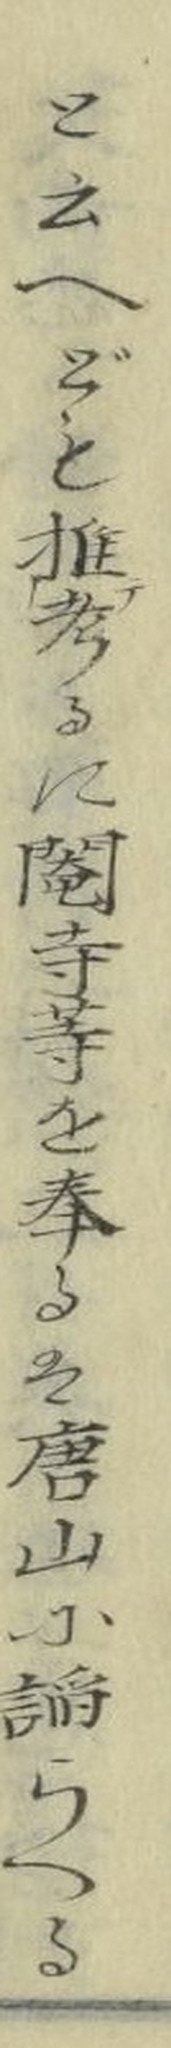と云へども推-考るに閹寺等を奉るは唐山に謟らへる
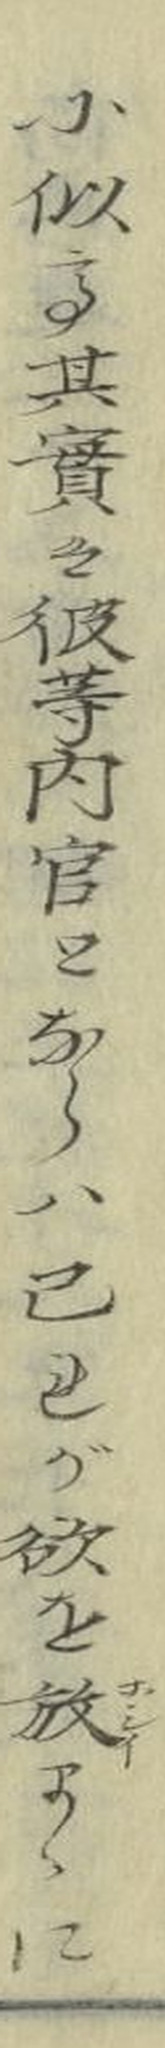に以て其実は彼等内官とならは己れが欲を放まヽに
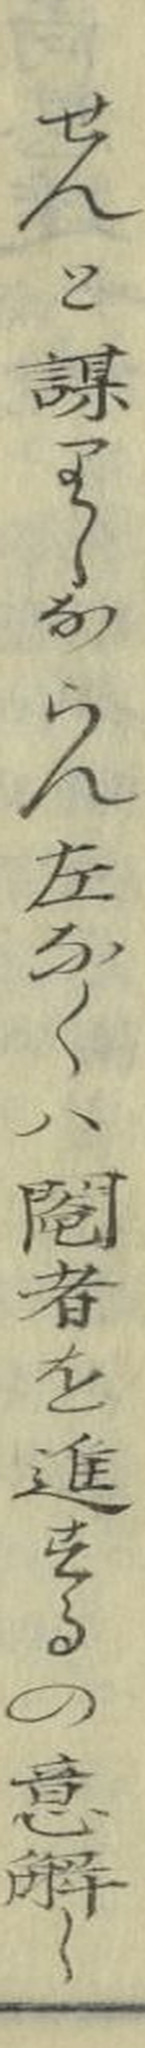せんと謀りしならん左なくは閹者を進するの意解し
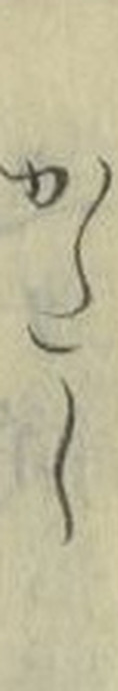かたし
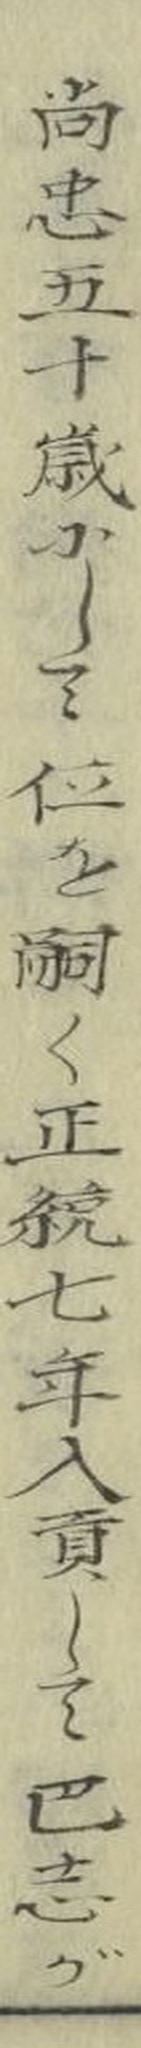尚忠五十歳にして位を嗣く正統七年入貢して巴志が
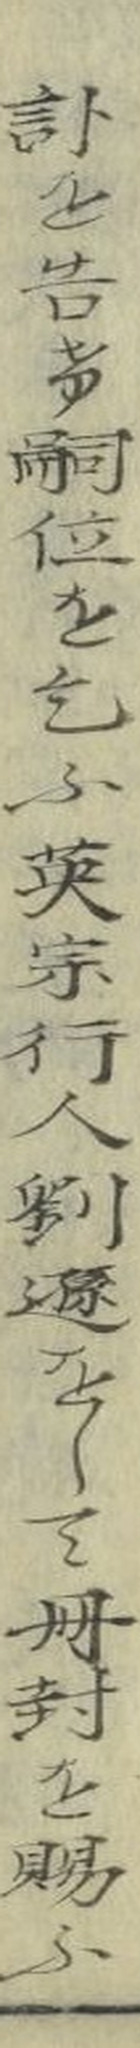訃を告け嗣位を乞ふ英宗行人劉遜をして冊封を賜ふ

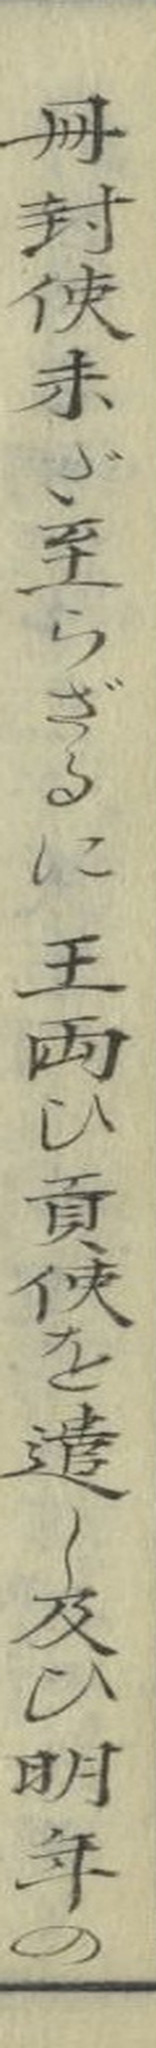冊封使未だ至らざるに王両ひ貢使を遣し及ひ明年の
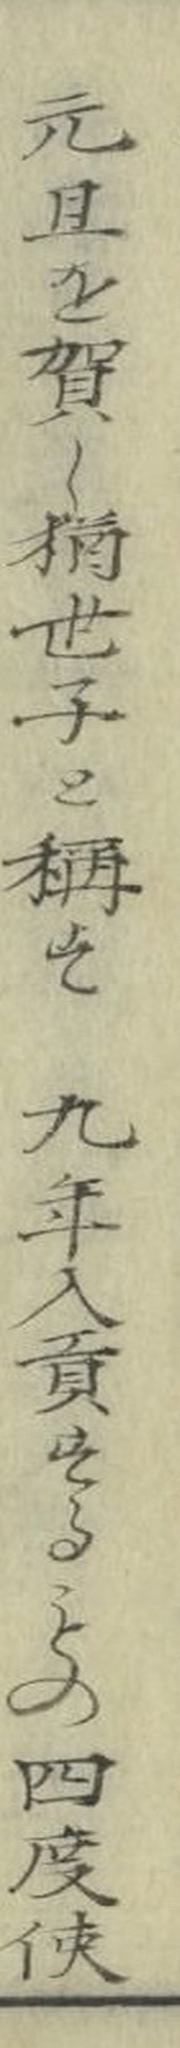元旦を賀し猶世子と称す九年入貢するもの四度使
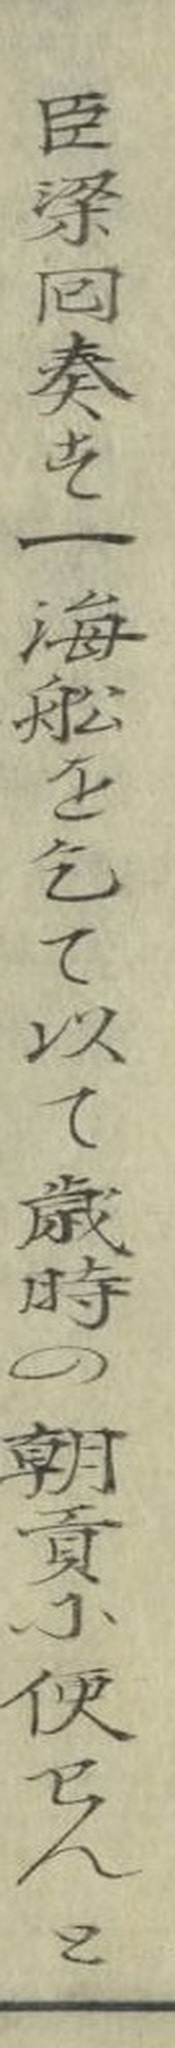臣梁回奏す一海舩を乞て以て歳時の朝貢に使せんと
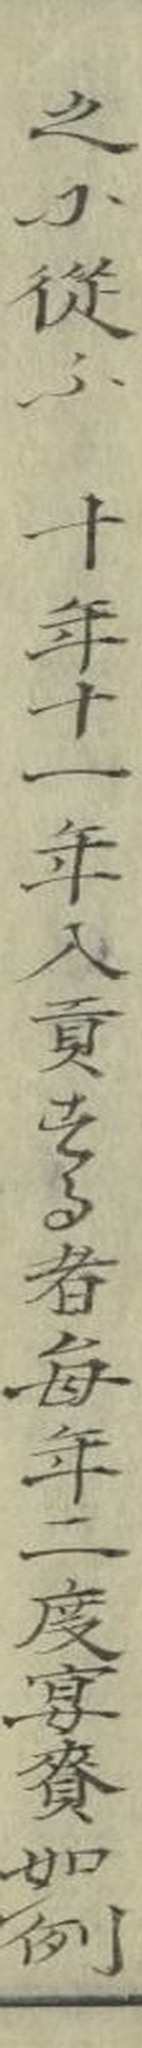之に従ふ十年十一年入貢する者毎年二度宴賚如例
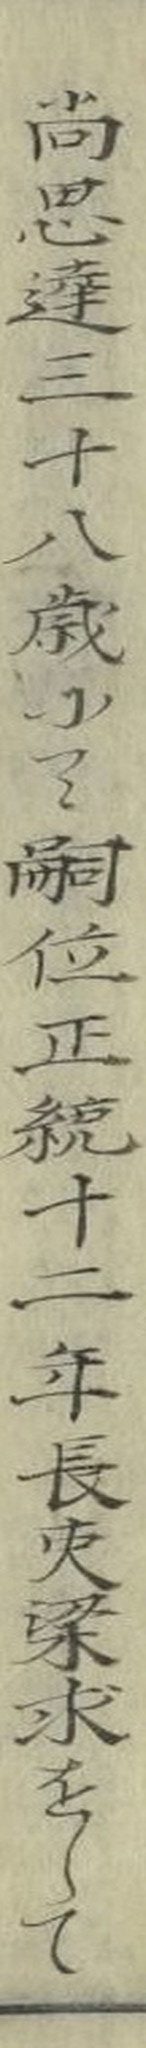尚思達三十八歳にて嗣位正統十二年長吏梁求をして
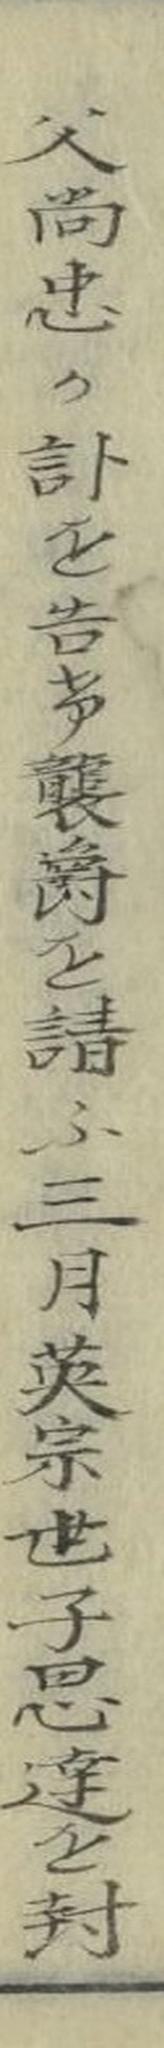父尚忠か訃を告け襲爵を請ふ三月英宗世子思達を封
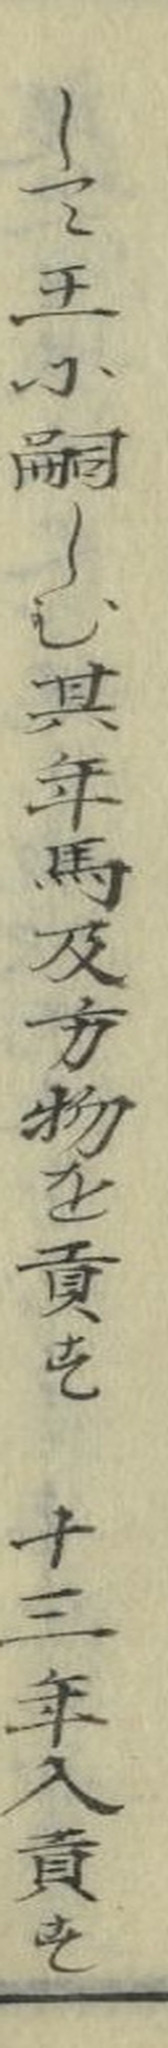して王に嗣しむ其年馬及方物を貢す十三年入貢す
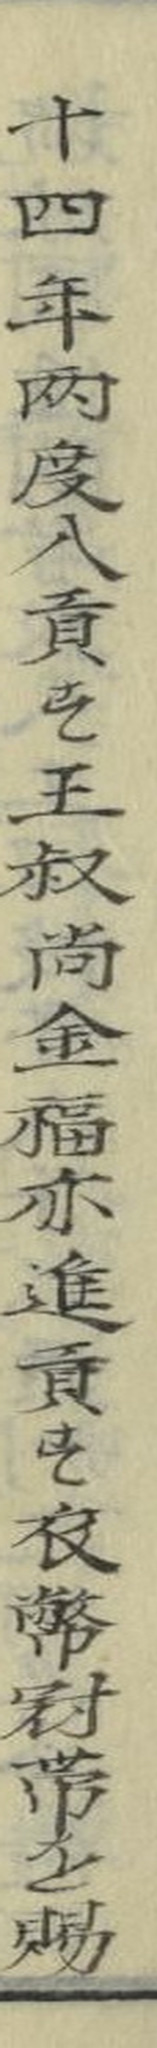十四年両度入貢す王叔尚金福亦進貢す衣幣冠帯を賜
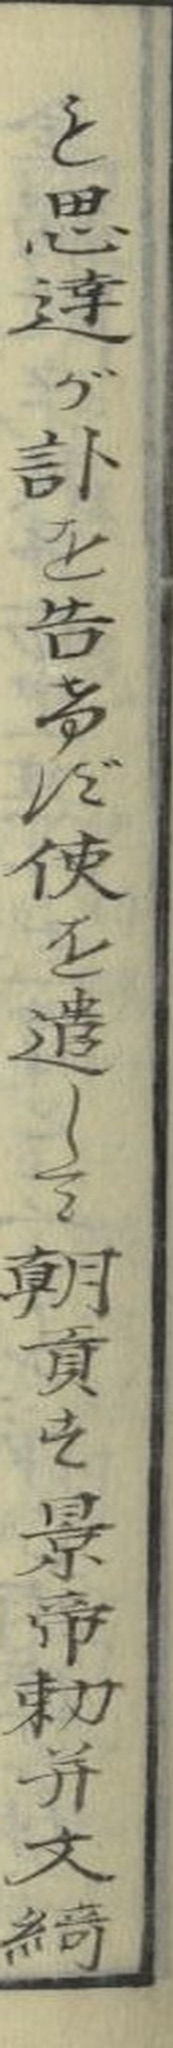も思達が訃を告けず使を遣して朝貢す景帝勅并文綺
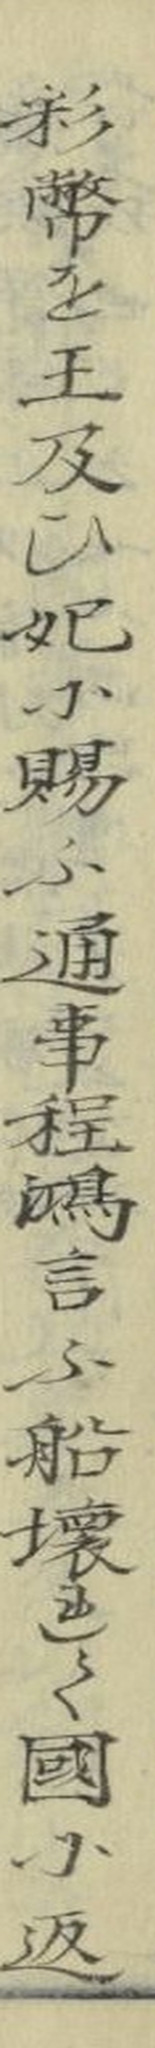彩幣を王及ひ妃に賜ふ通事程鴻言ふ船壊れて国に返
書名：琉球沿革志 下
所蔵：University of the Ryukyus Library
